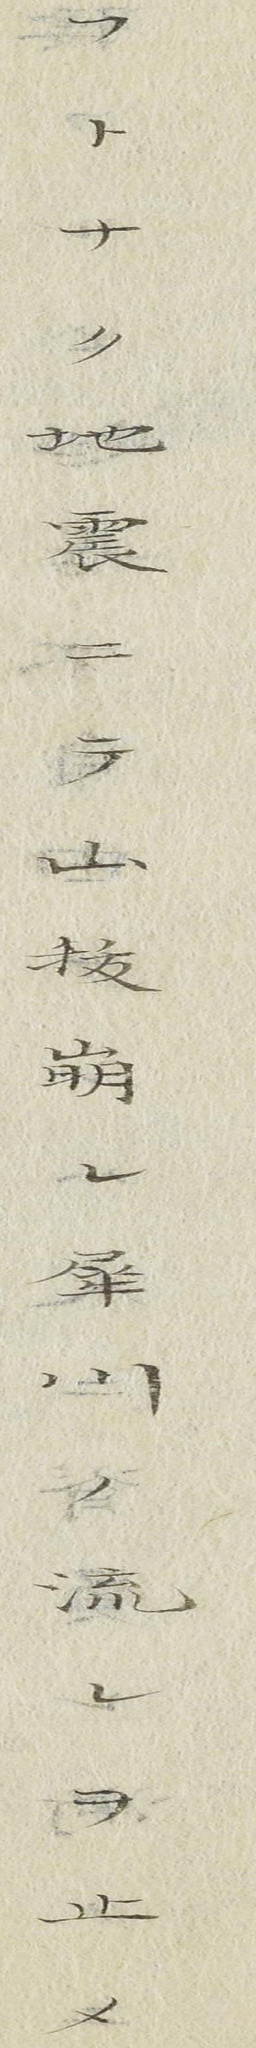フトナク地震ニテ山抜崩レ犀川ノ流レヲ止メ
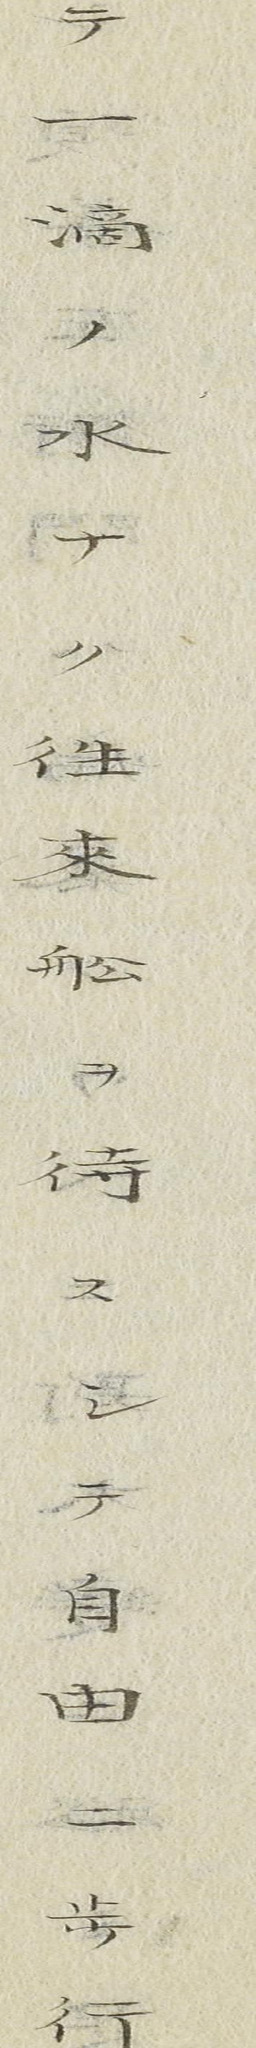テ一滴ノ水ナク往来船ヲ待スシテ自由ニ歩行
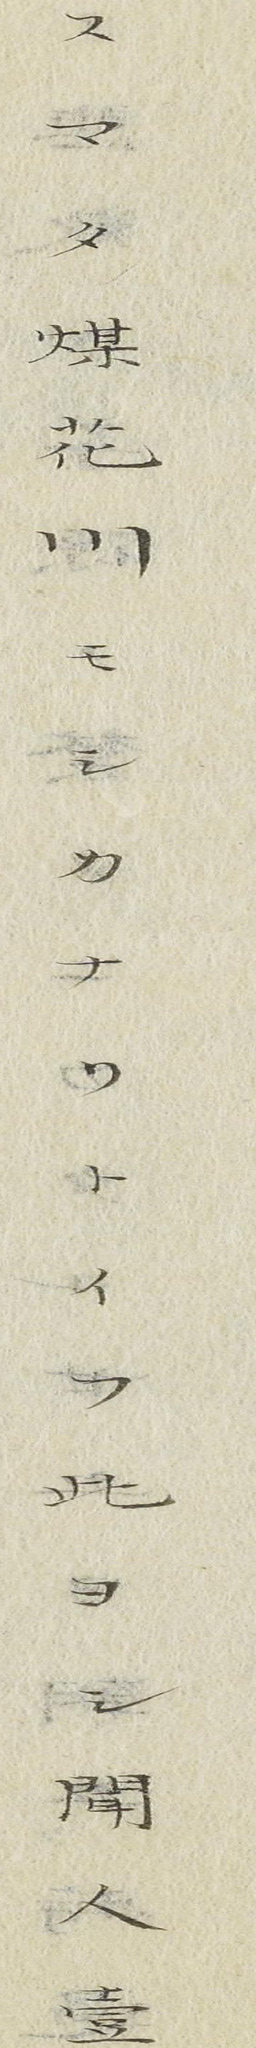スマタ煤花川モシカナリトイフ此ヨシ聞人壹
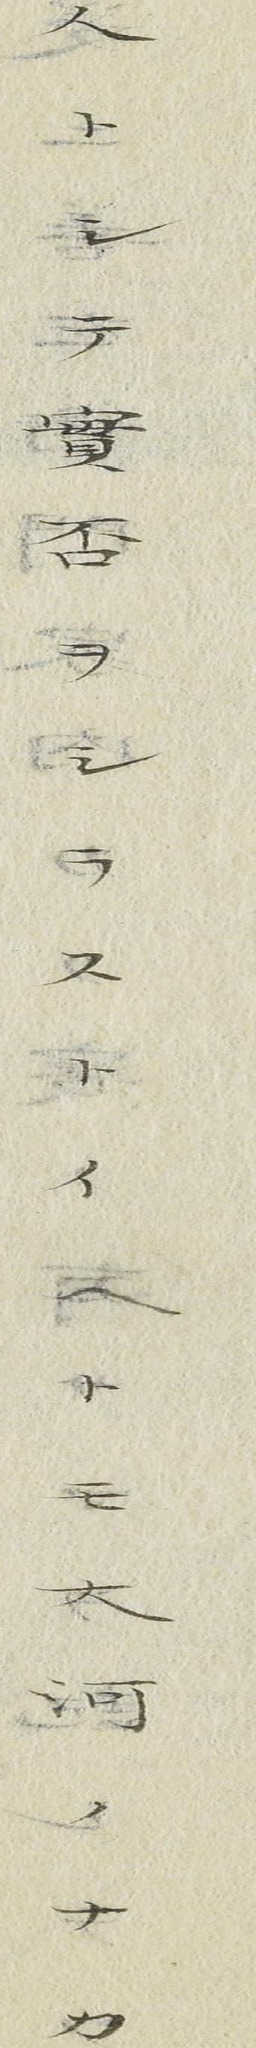人トシテ実否ヲシラストイヘトモ大河ノナカ
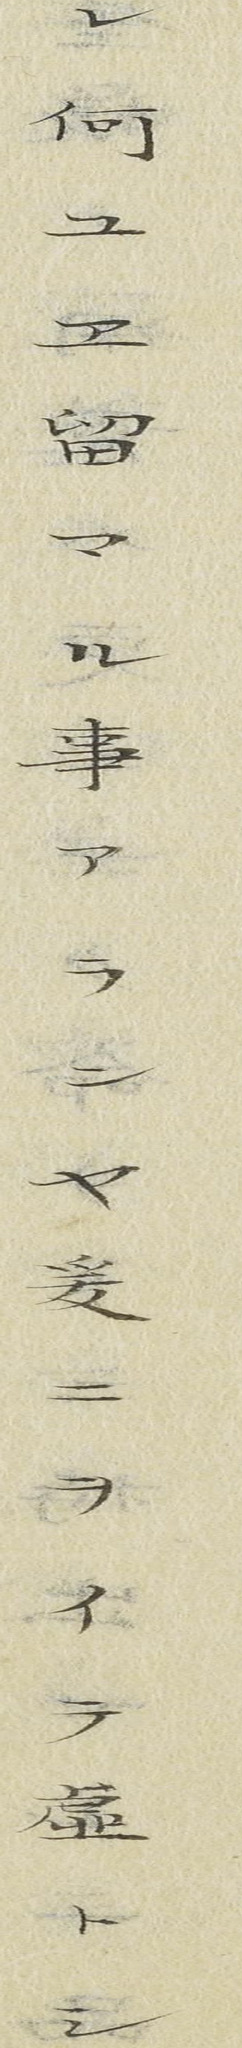レ何ユエ留マル事アランヤ爰ニヲイテ虚トシ
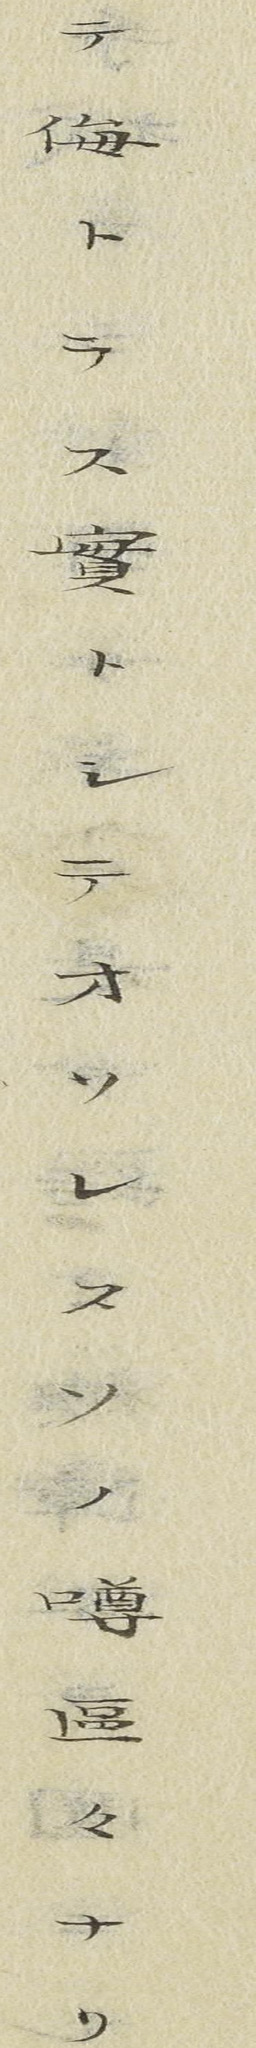テ侮トラス実トシテオソレスソノ噂区々ナリ
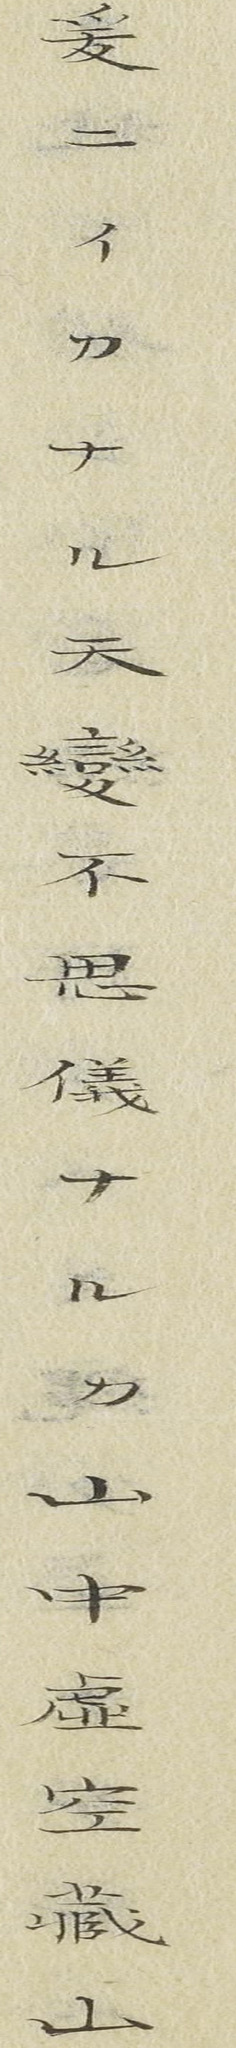爰ニイカナル天変不思儀ナルカ山中虚空蔵山
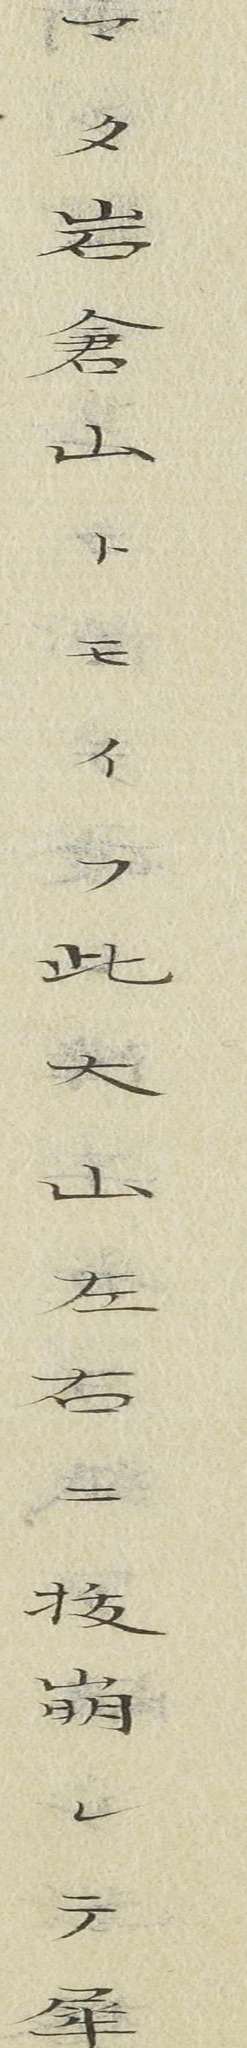マタ岩倉山トモイフ此大山左右ニ抜崩レテ犀
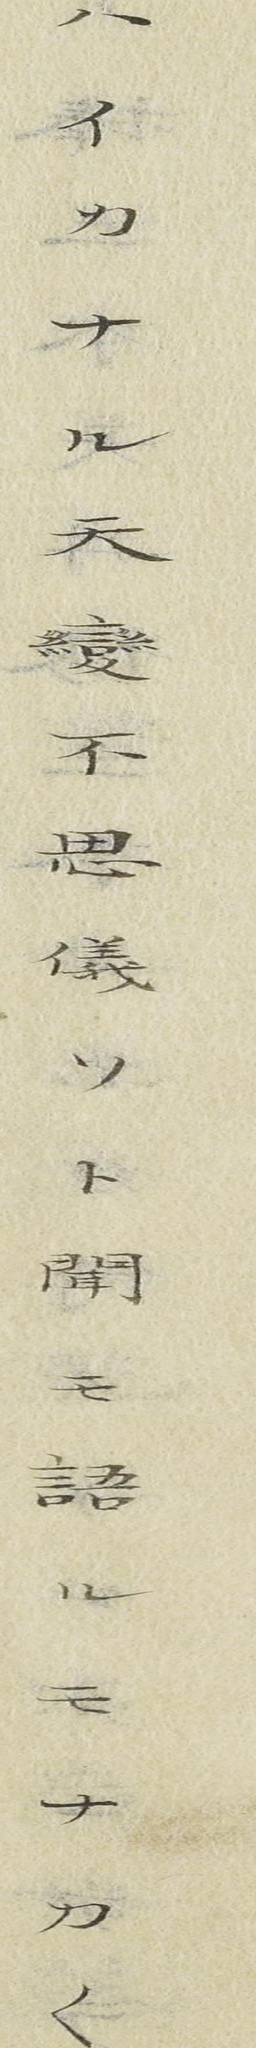ハイカナル天変不思儀ソト聞モ語ルモナカ〱
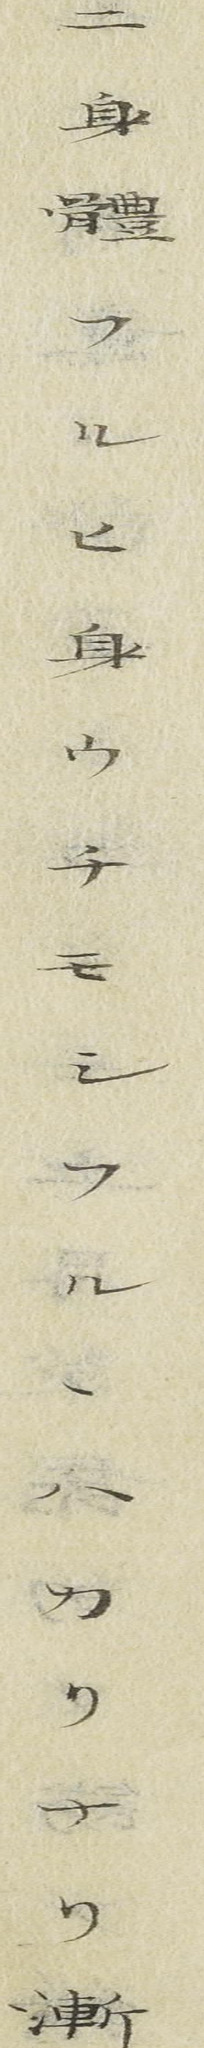ニ身体フルヒ身ウチモシフルヽハカリナリ漸
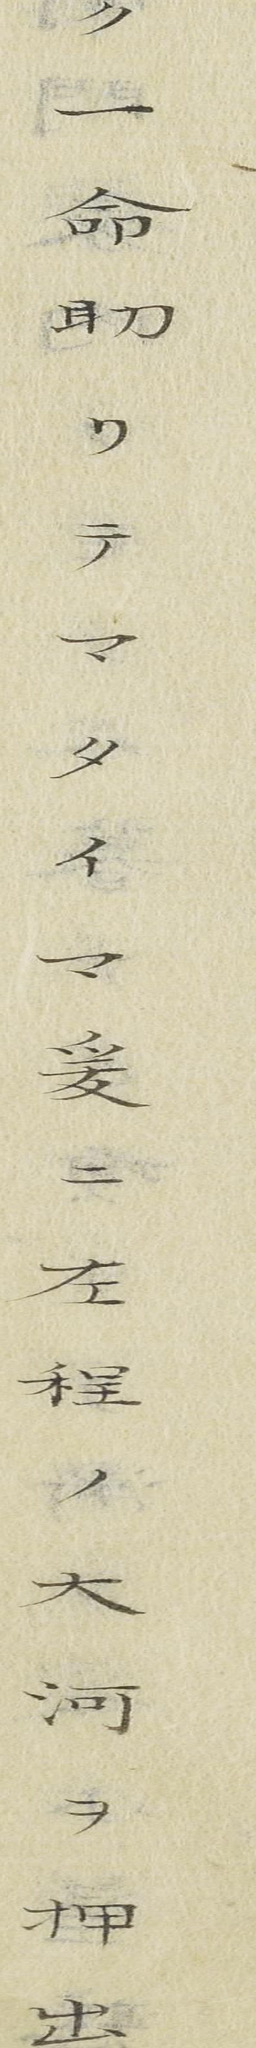ク一命助リテマタイマ爰ニ左程ノ大河ノ押出
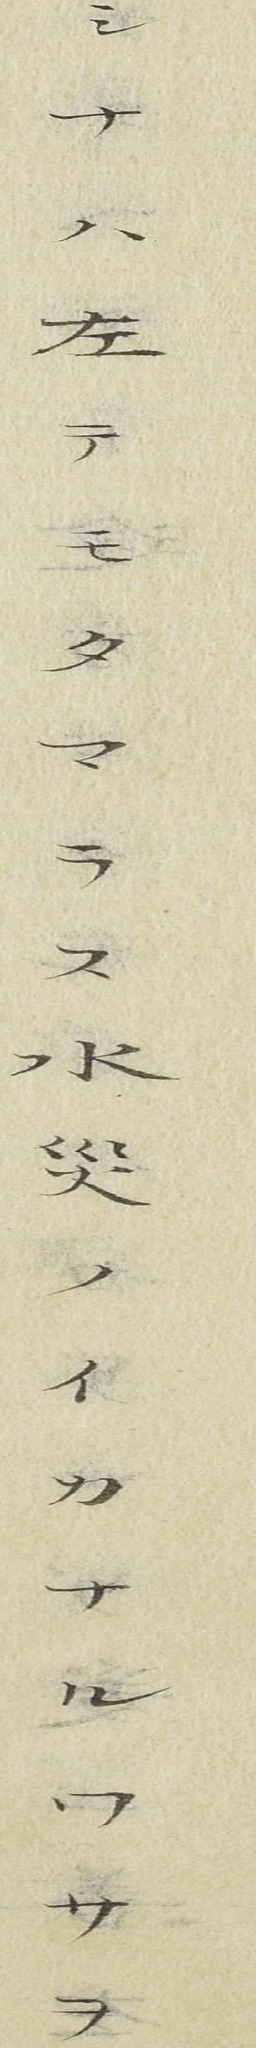シナハ左テモタマラス水災ノイカナルワサヲ

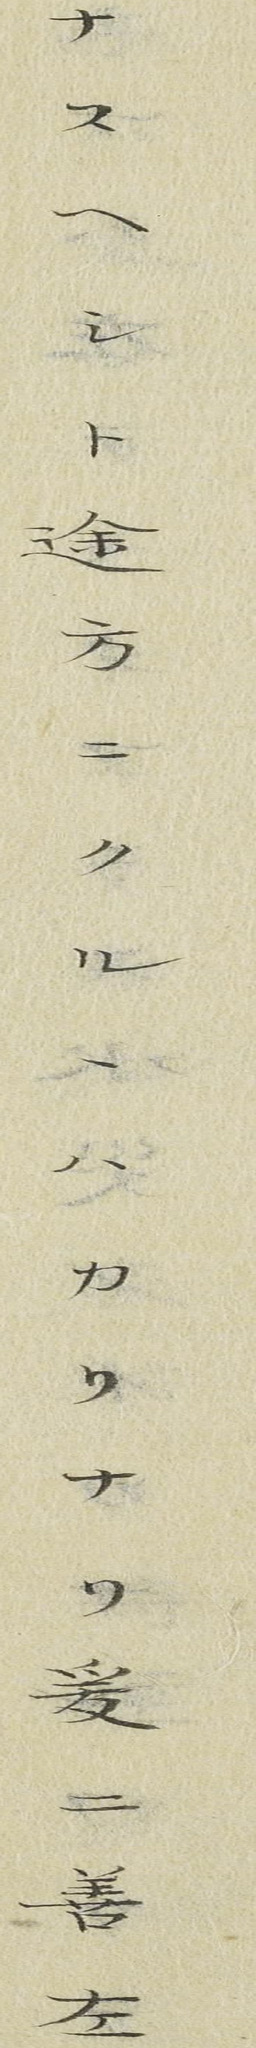ナスヘシト途方ニクルヽハカリナリ爰ニ善左
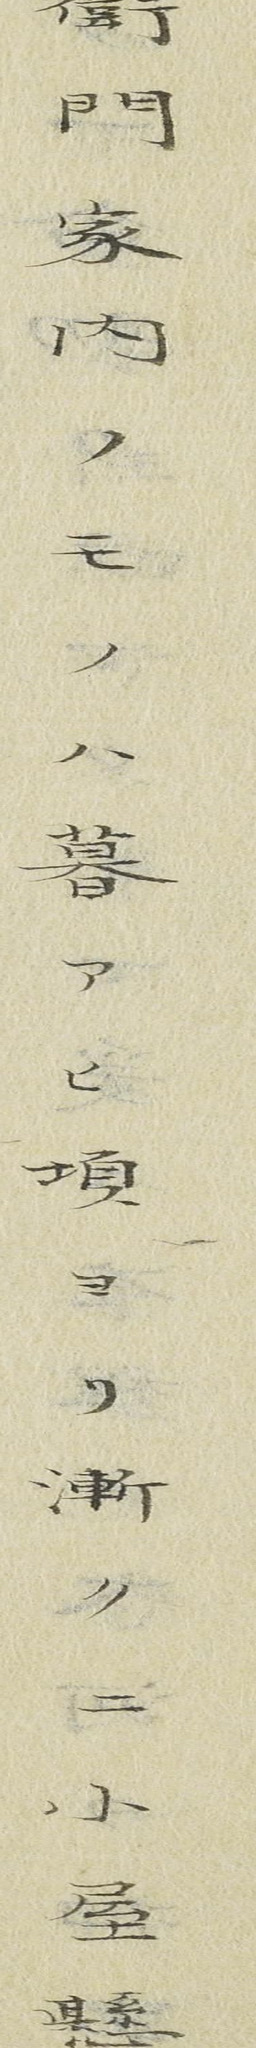衛門家内ノモノハ暮アヒ頃ヨリ漸クニ小屋懸
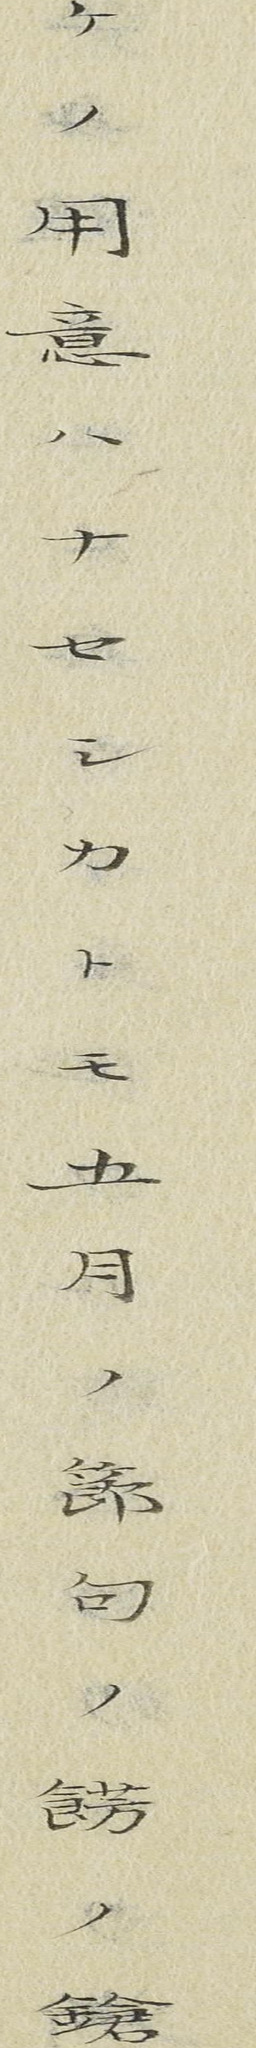ケノ用意ハナセシカトモ五月ノ節句ノ餝ノ鎗
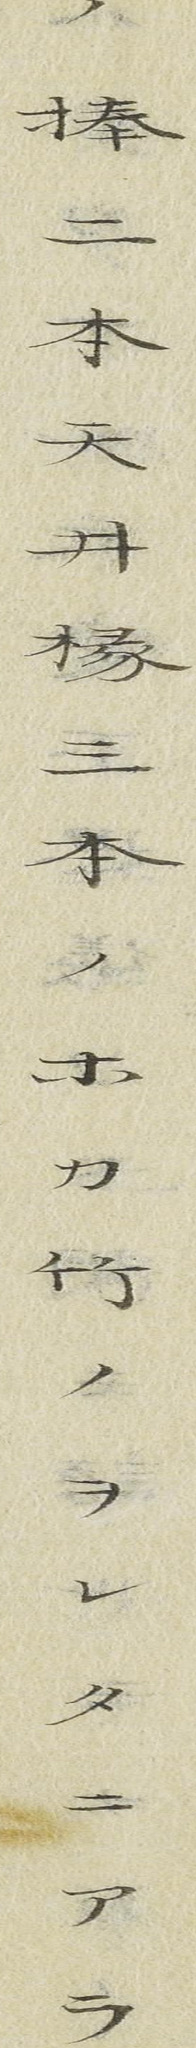ノ棒ニ本天井椽三本ノホカ竹ノヲレタニアラ
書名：地災撮要　地震之部　巻ノ二
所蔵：東京大学地震研究所図書室 Earthquake Research Institute Library, The University of Tokyo, JAPAN
